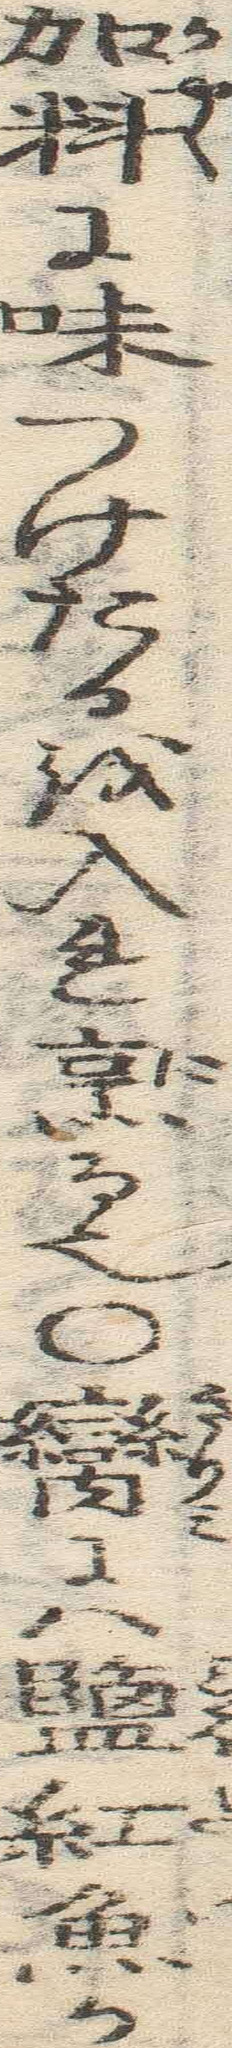加料に味つけたるを入れ烹る也○臠には盬紅魚か
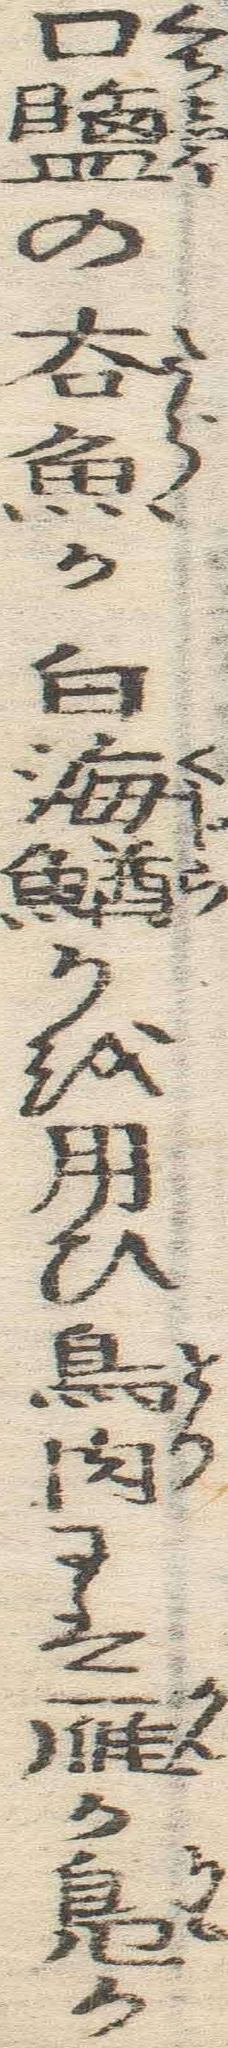口鹽の夻魚か白海鰌かを用ひ鳥肉には雁か鳬か
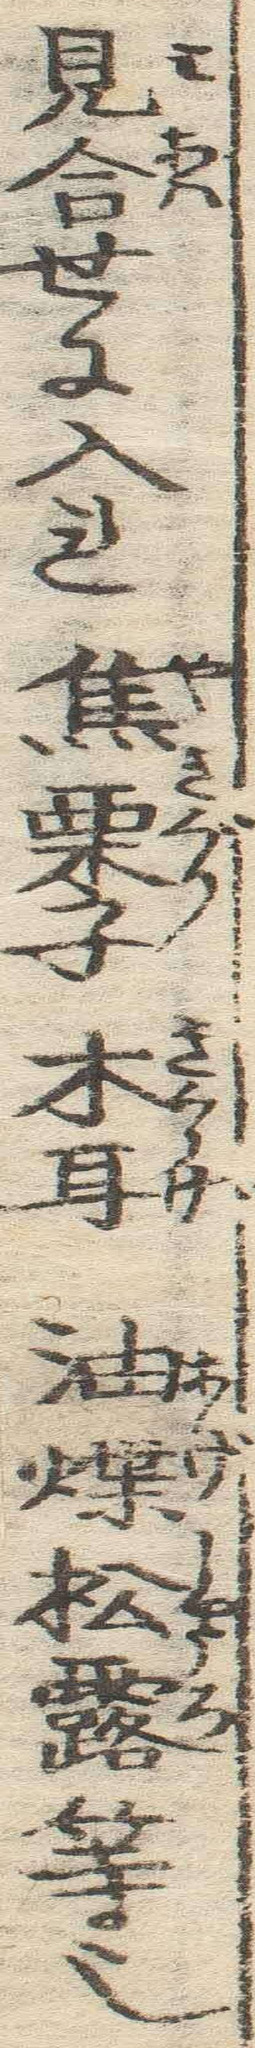見合せに入れ焦栗子木耳油煠松露等也

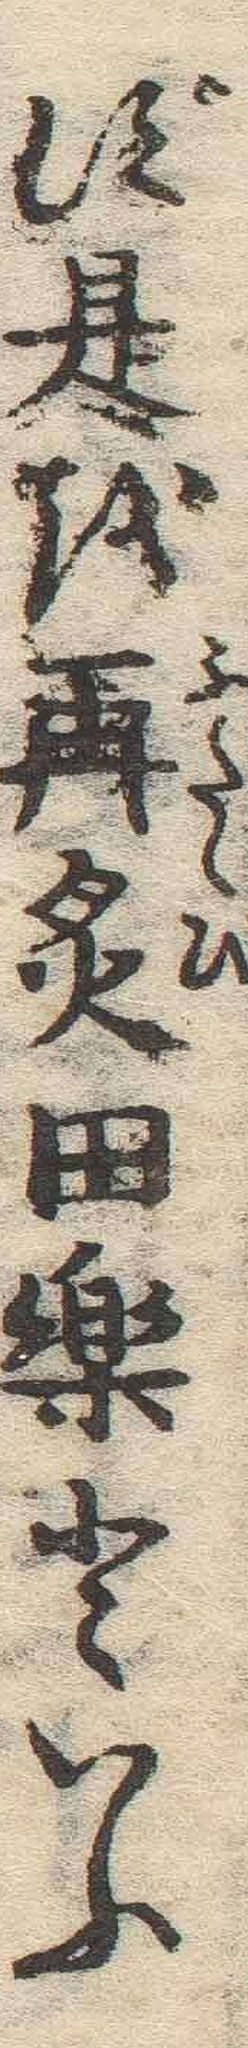ずこれを再炙田楽といふ
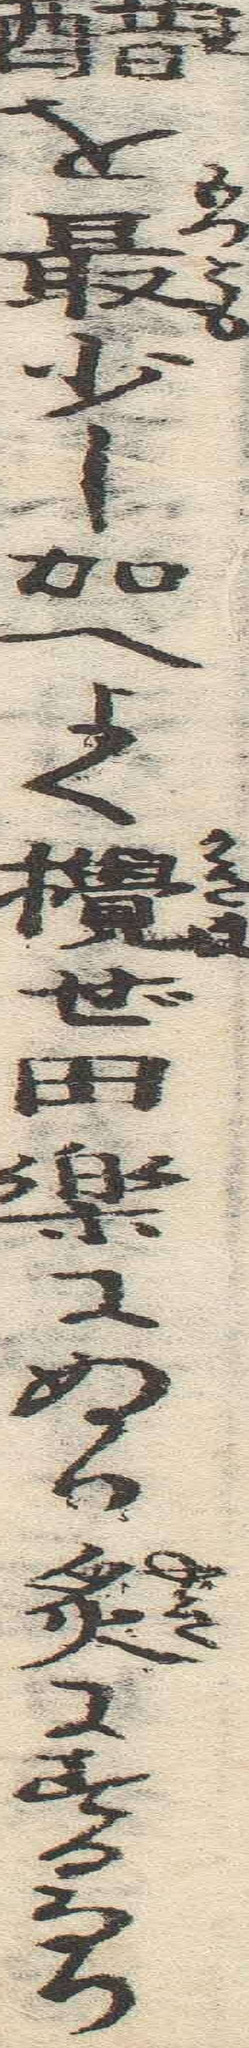醋を最少し加へよく攪ぜ田楽にぬり炙にするなり
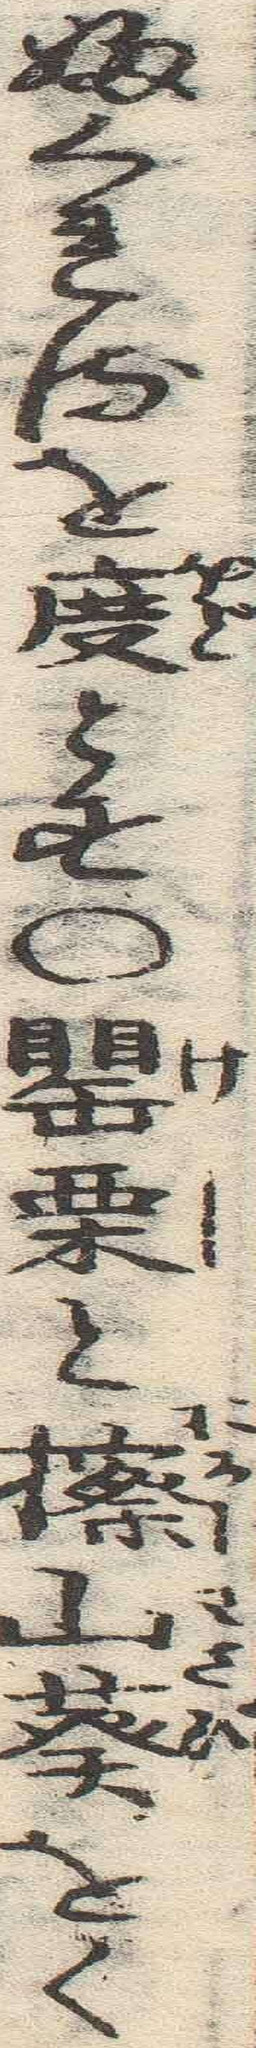ふくれるを度とす○罌粟と擦山葵をく
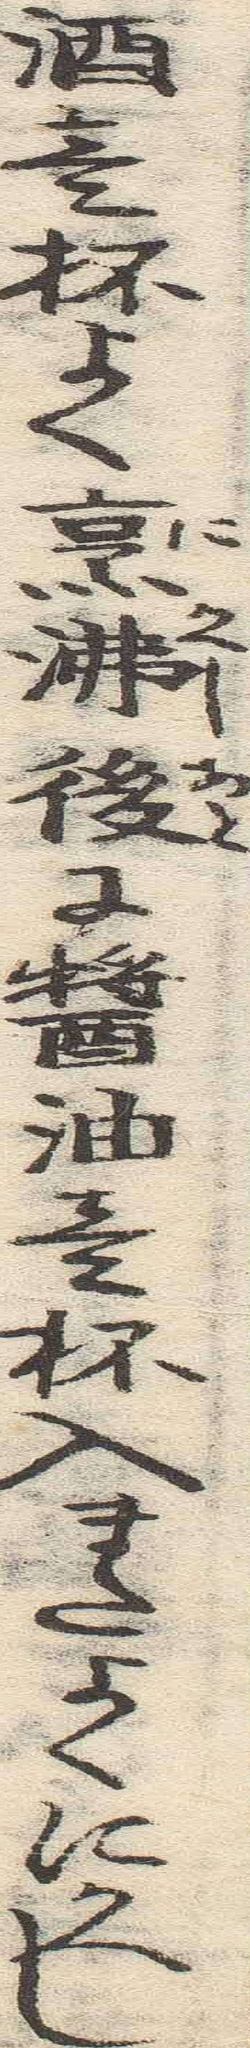酒壱杯よく烹沸後に醤油壱杯入またよくにかへし
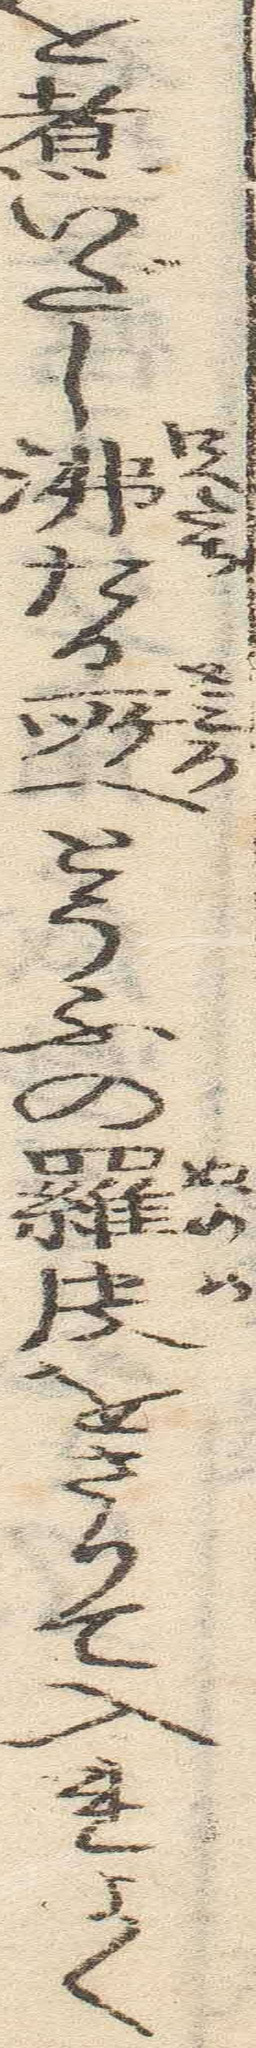を煮いだし沸たる所へとうのふ羅皮をさりて入れよく
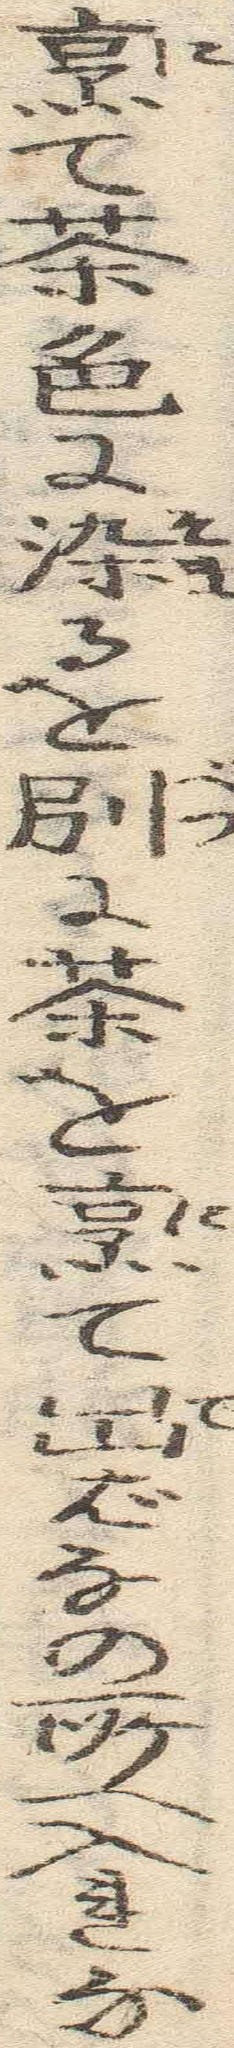烹て茶色に染るを別に茶を烹て出ばなの所へ入れな
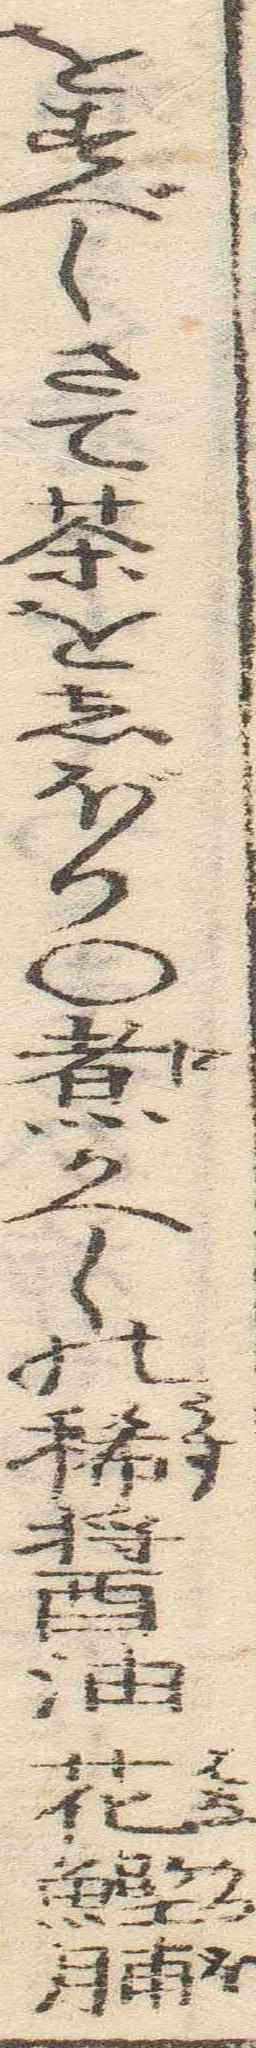をすべしさて茶をしぼり○煮かへしの稀醤油花鰹脯
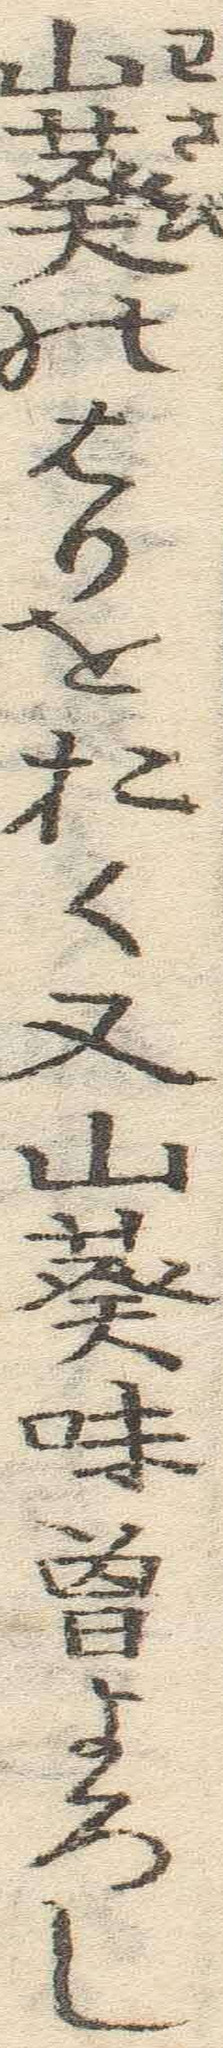山葵のはりをおく又山葵味曽よろし
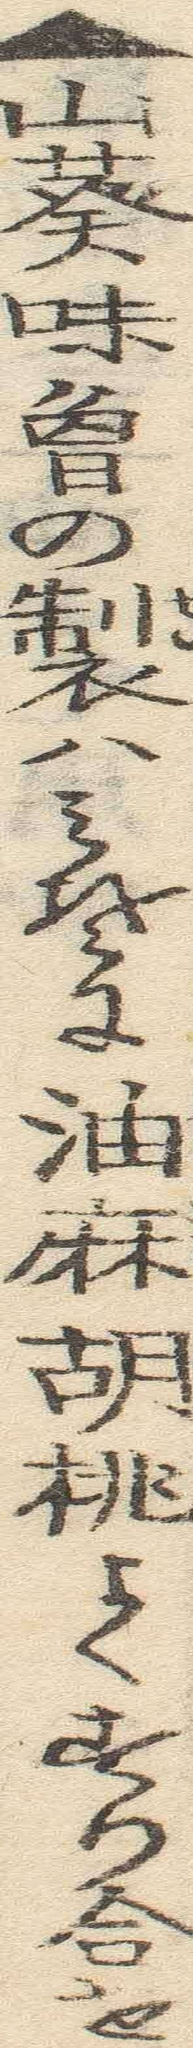▲山葵味曽の製はみそに油麻胡桃よくすり合せ
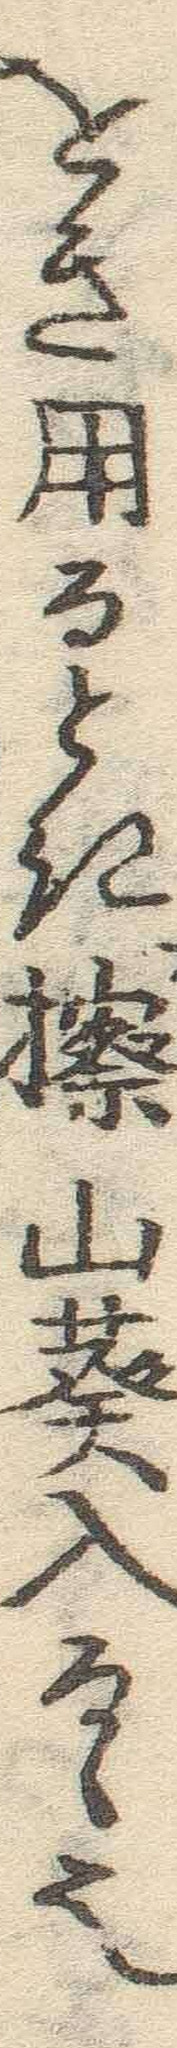をき用るとき擦山葵入るゝ也
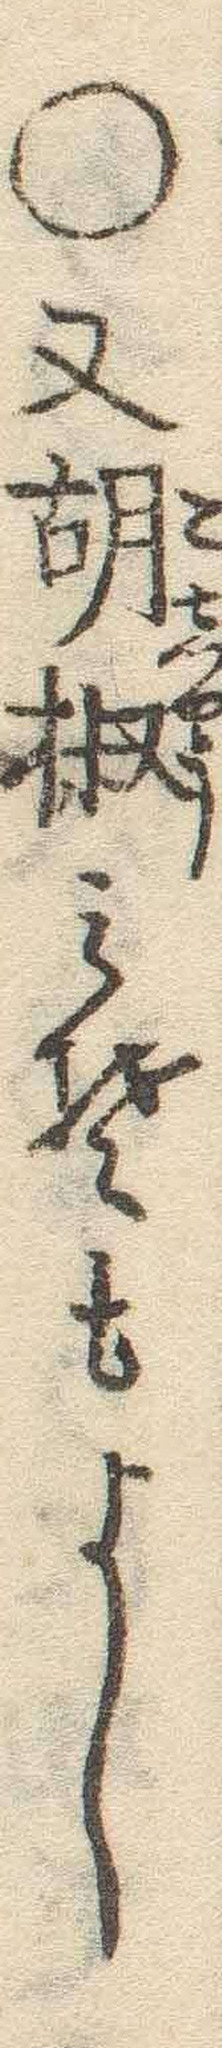○又胡椒みそもよし

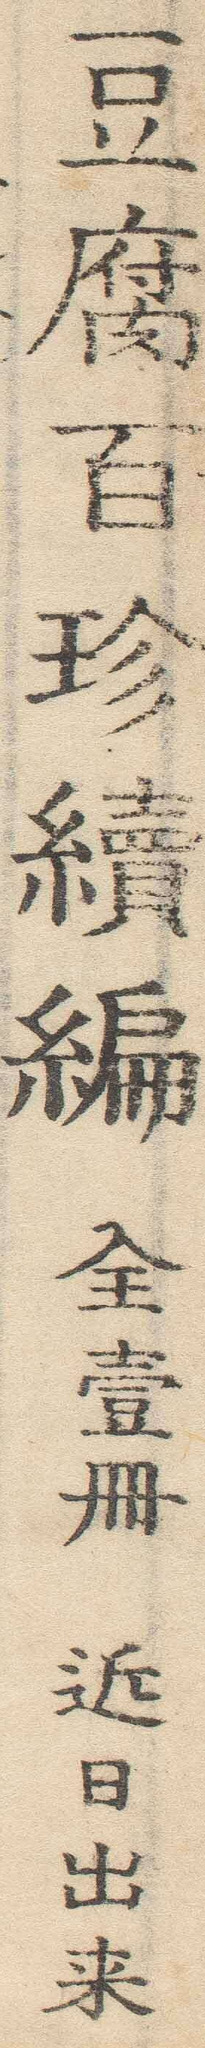豆腐百珍続編全一冊近日出来
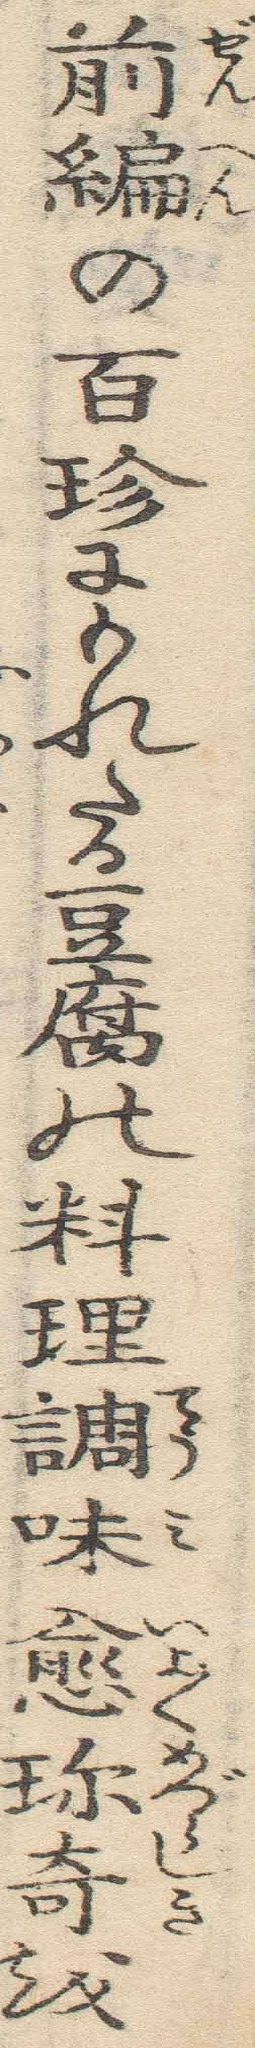前編の百珍にもれたる豆腐の料理調味愈珎奇を
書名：豆腐百珍
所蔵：東京学芸大学附属図書館 国文学研究資料館
